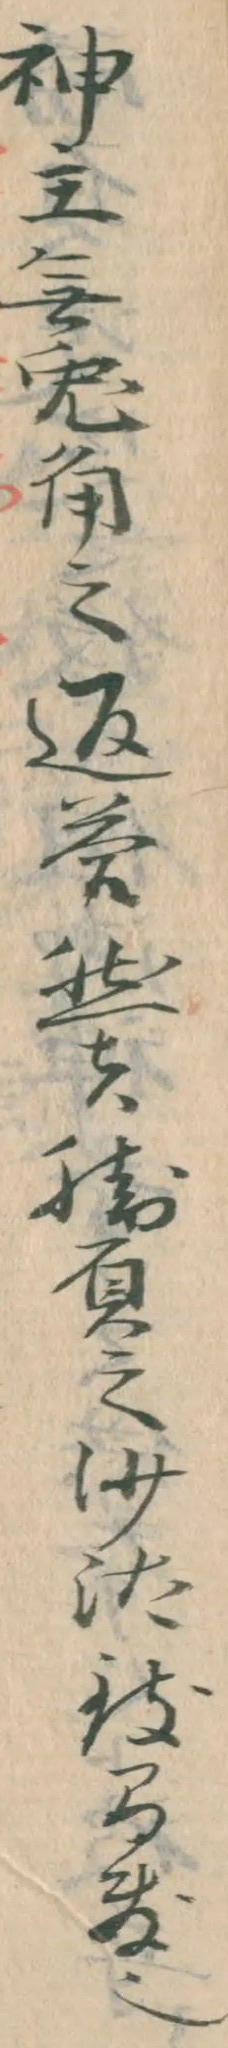神主無兎角之返答然者勝負之沙汰致間敷也
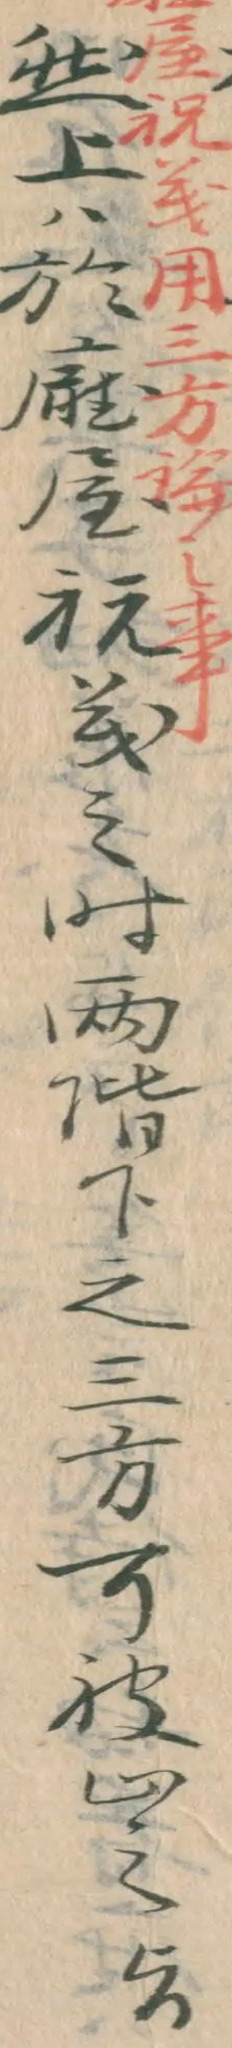然上ハ於庁屋祝義之時両階下之三方可被止之旨
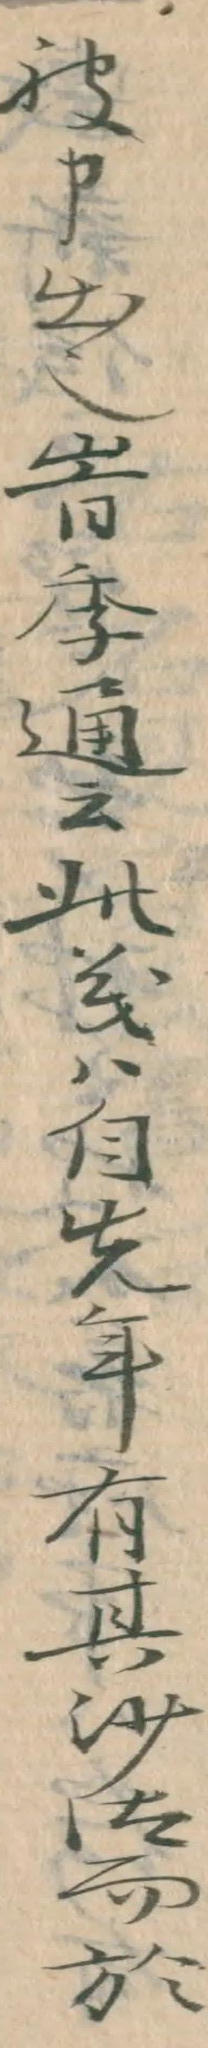被申出也旹季通云此義ハ自先年有其沙汰而於
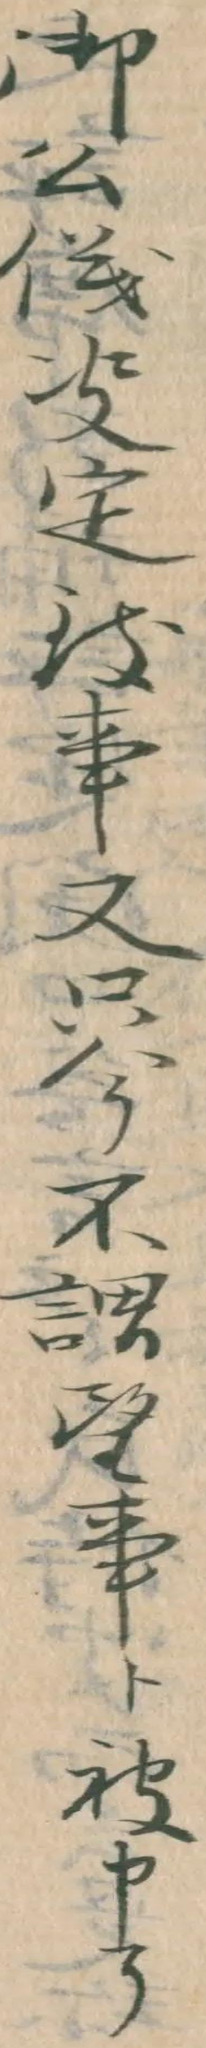御公儀決定致事又只今不謂望事ト被申了
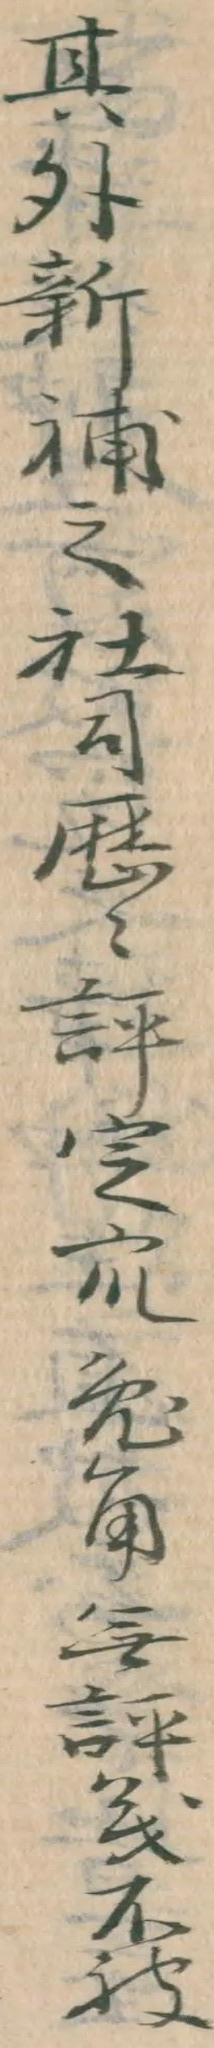其外新補之社司歴々評定衆兎角無評義不被
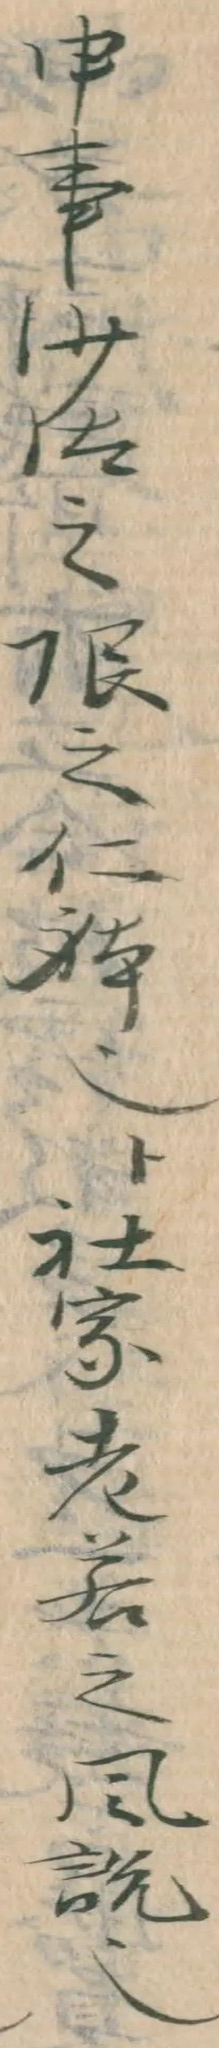申事沙汰之限之仁体也ト社家老若之風説也
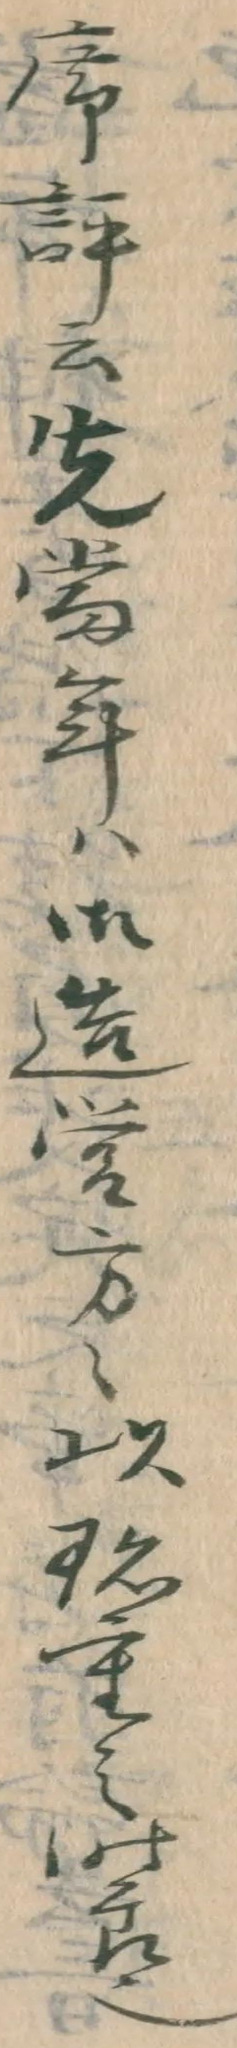序評云先当年ハ御造営方々以珍重之時節也
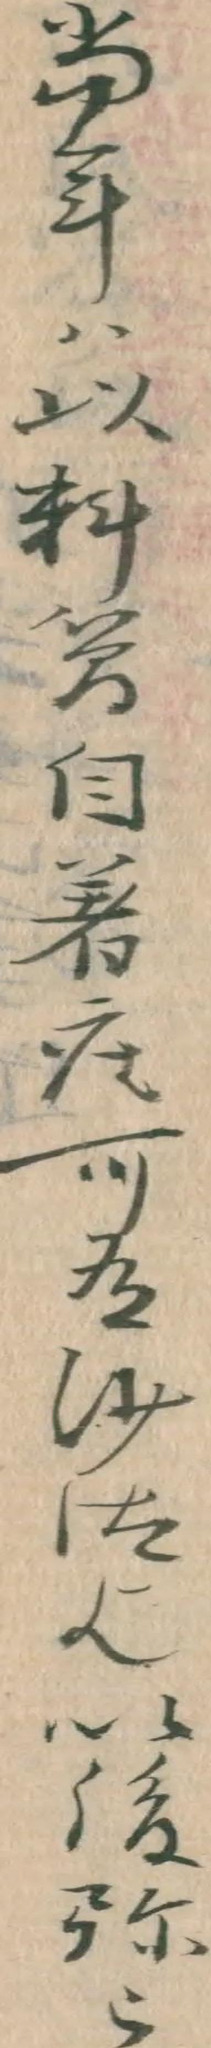当年ハ以料簡自着座可有沙汰也以後弥被
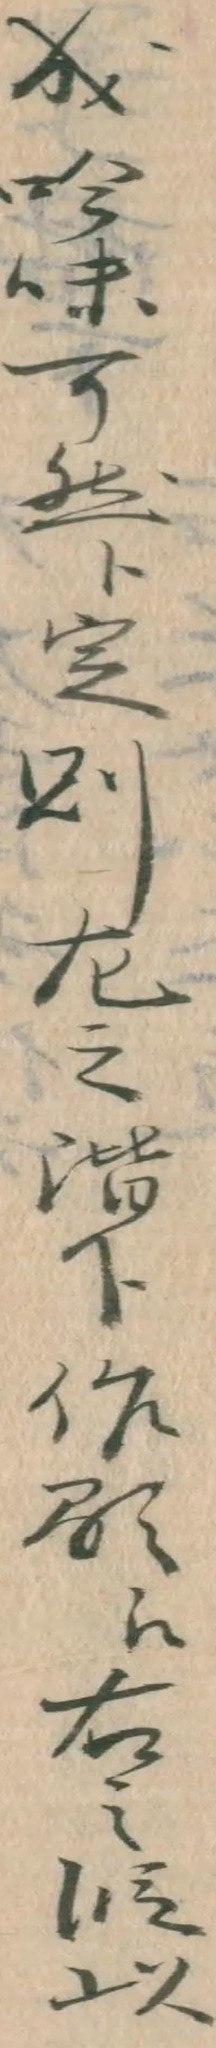成吟味可然ト定則左之階下作顕江右之段以
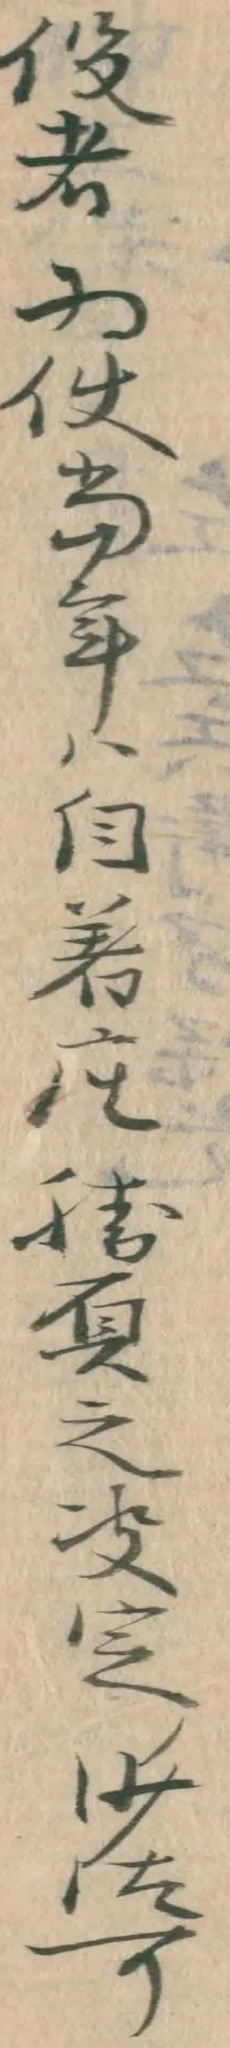役者為使当年ハ自着座勝負之決定ノ沙汰可
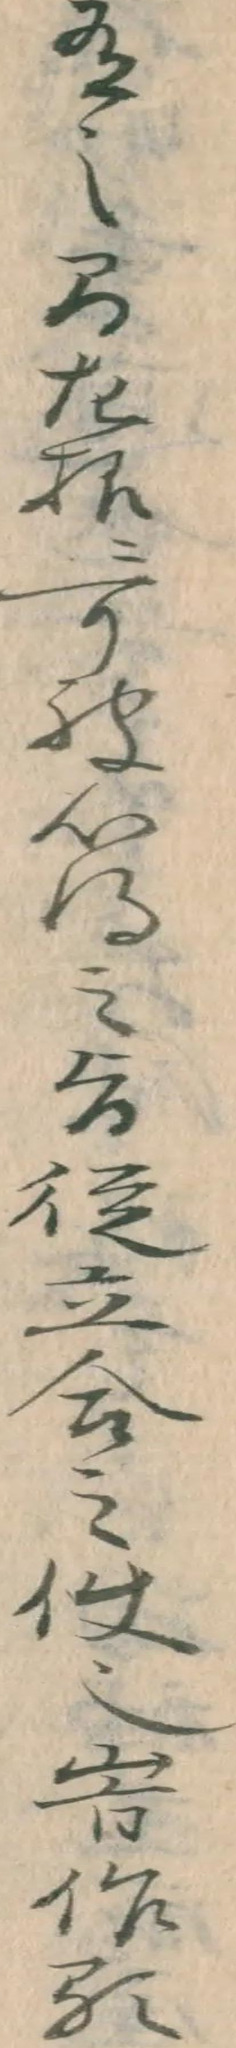有之間左様ニ可被心得之旨従立合之使也旹作顕
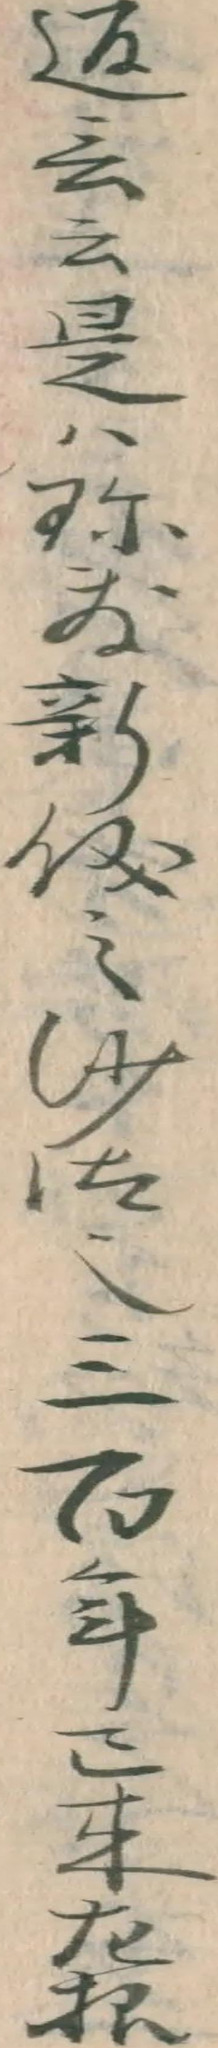返言云是ハ珍敷新儀之沙汰也三百年已来左様
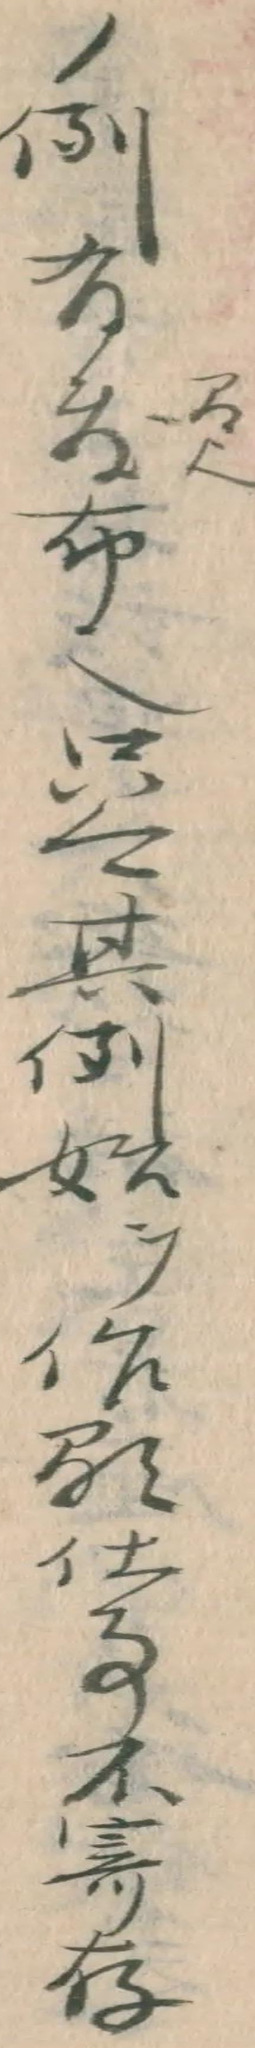ノ例有敷布也只可其例始ヲ作顕仕事不寄存
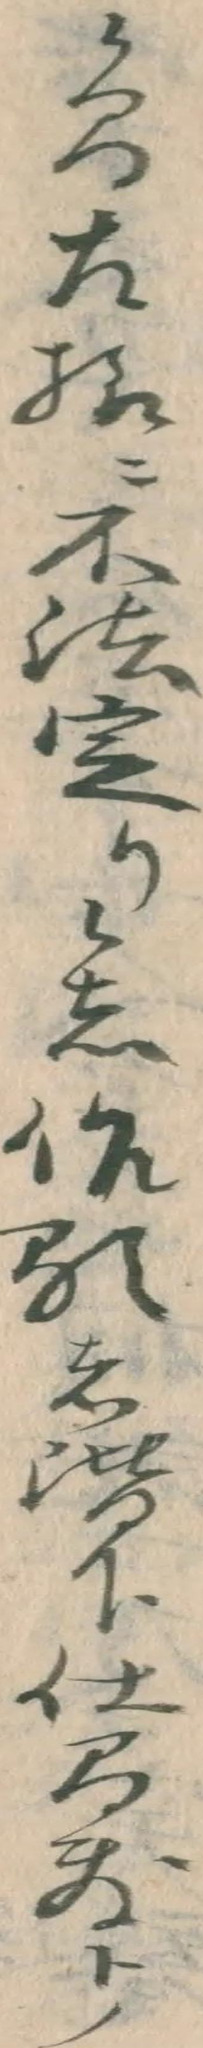候間左様ニ不法定リ候者作顕者階下仕間敷トノ
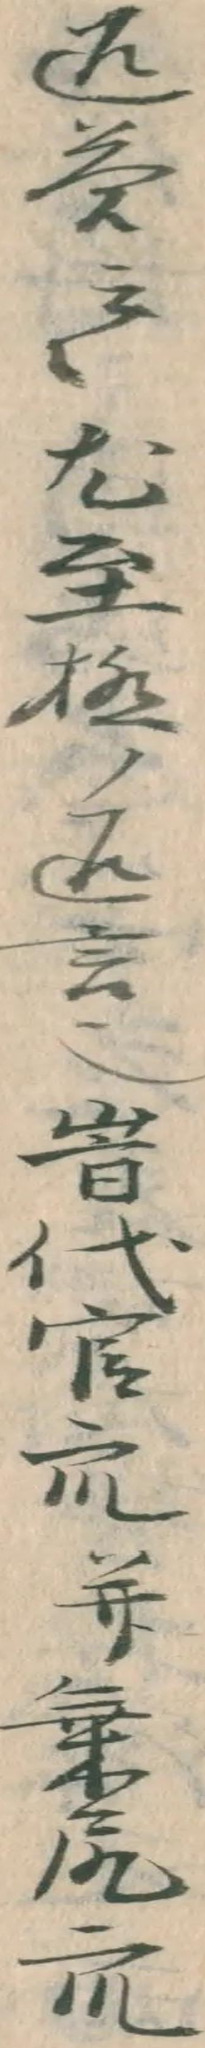返答云々尤至極ノ返言也旹代官衆并乗尻衆
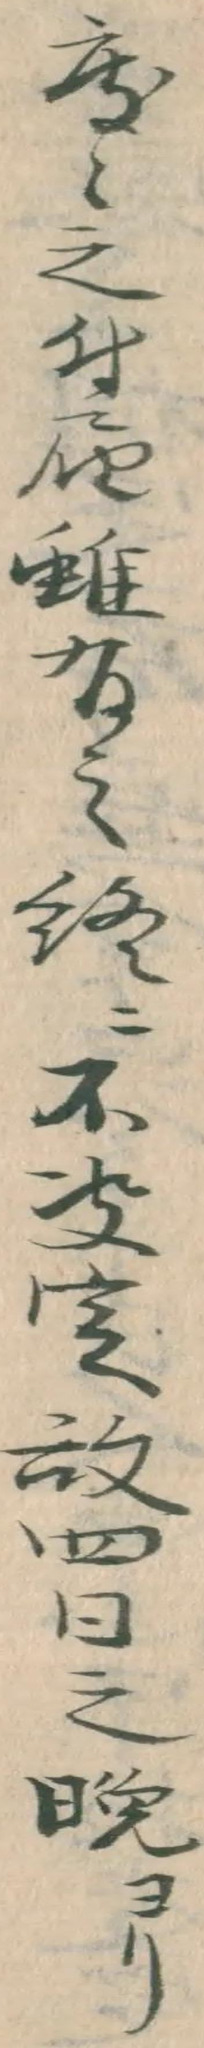度々之付届雖有之終ニ不決定故四日之晩ヨリ
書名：賀茂社記録. 第10冊
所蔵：国立国会図書館 National Diet Library, JAPAN
